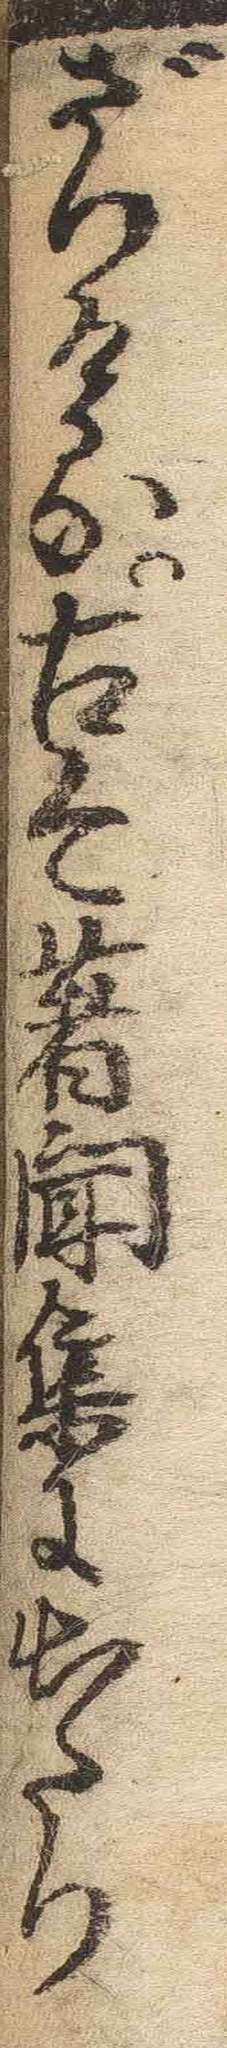ざりける。古今著聞集に出たり
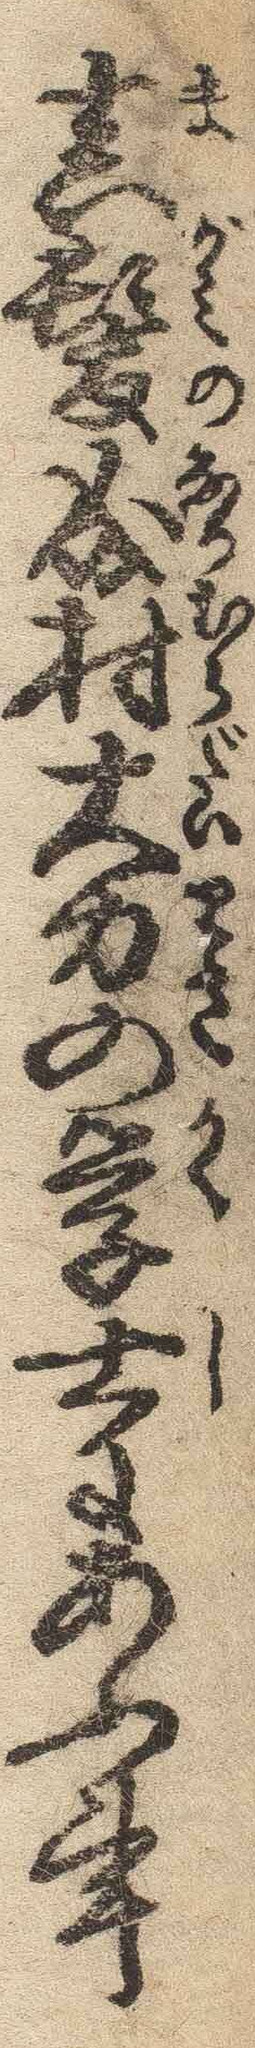真髪成村大力の学士にあふ事
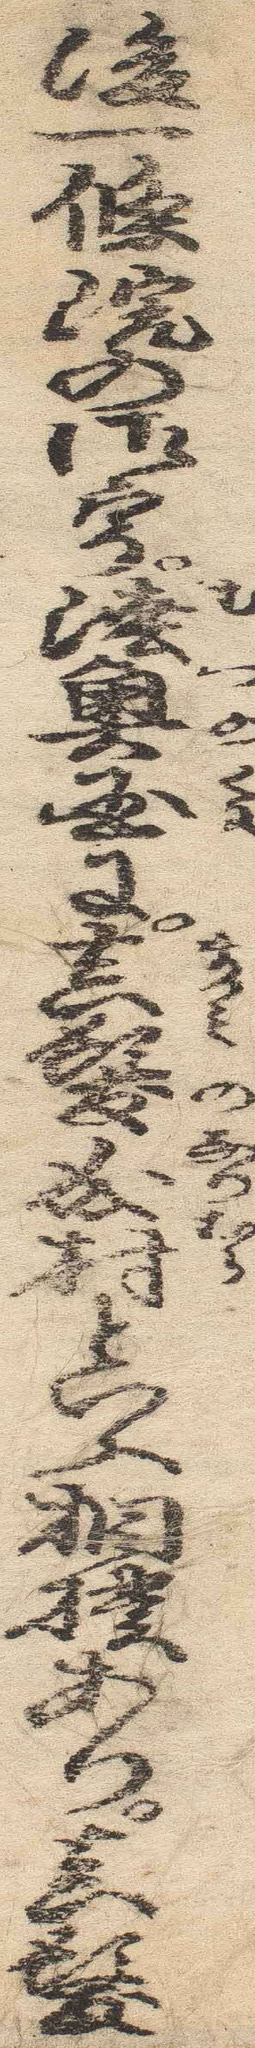後一條院の御宇陸奥国に真髪成村といふ相撲あり。真髪
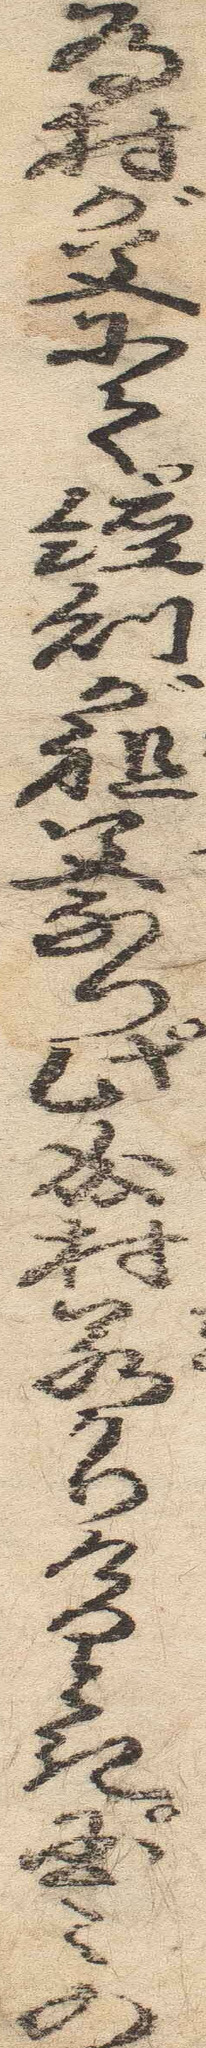為村が父にて経則か祖父なり。此成村若かりしとき。国々の
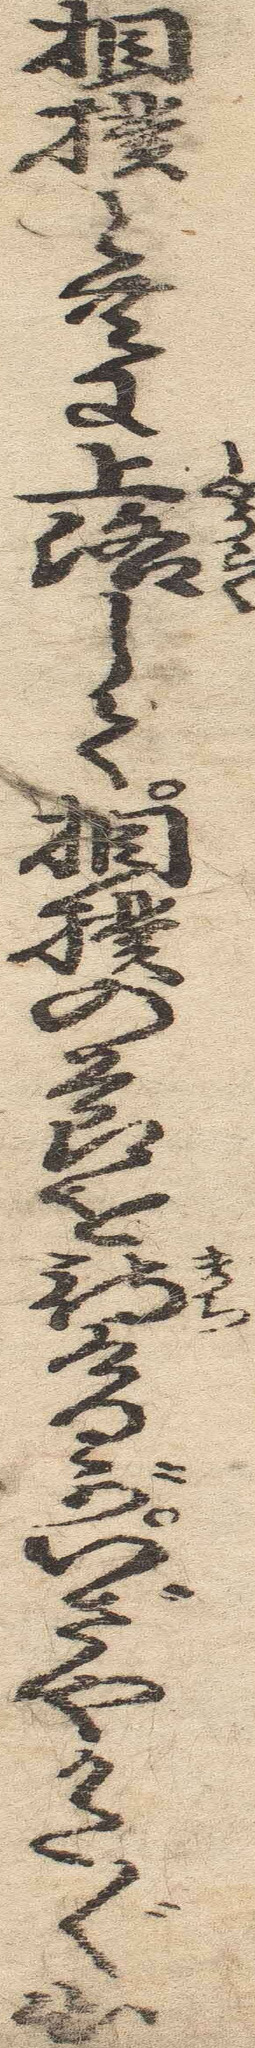相撲と共に上洛して。相撲の節を待けるが。いざやかた〴〵出
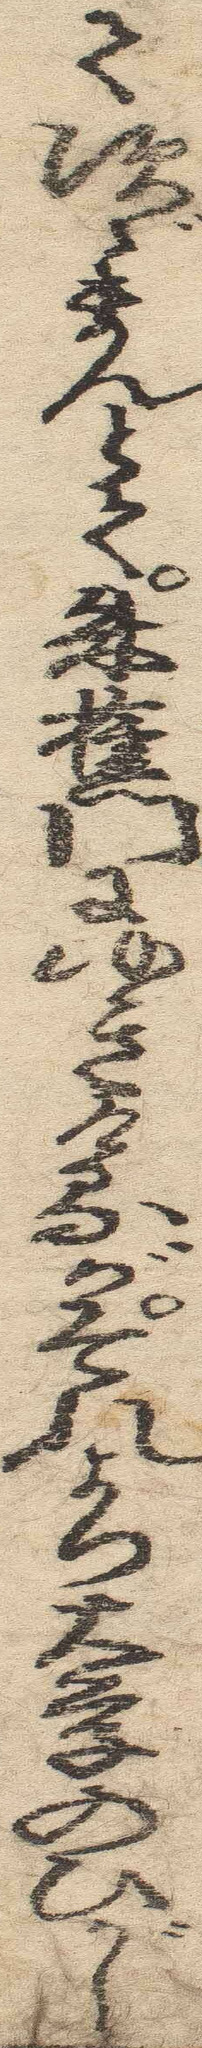て次涼ゞまんとて朱雀門にゆきけるが。それより大学のひがし
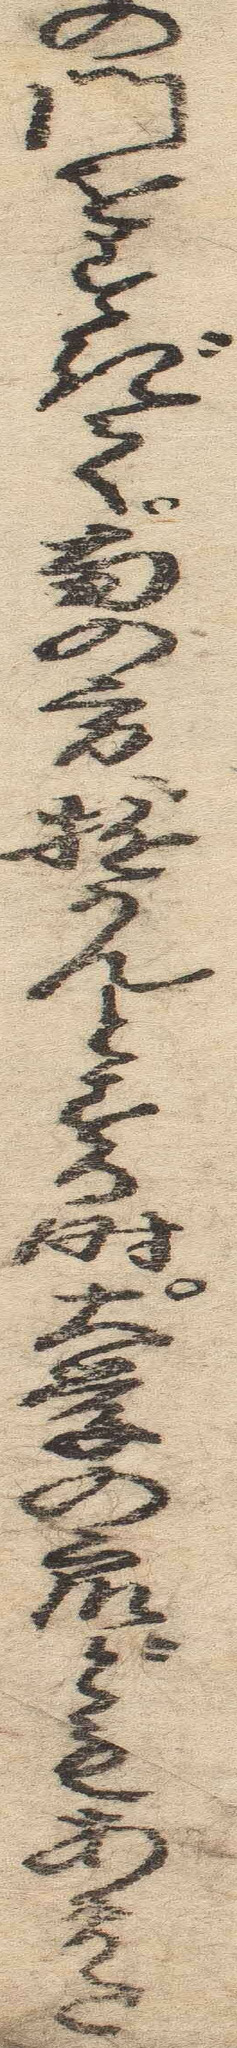の門をすぎて。南の方へゆかんとする時。大学衆どもあまた
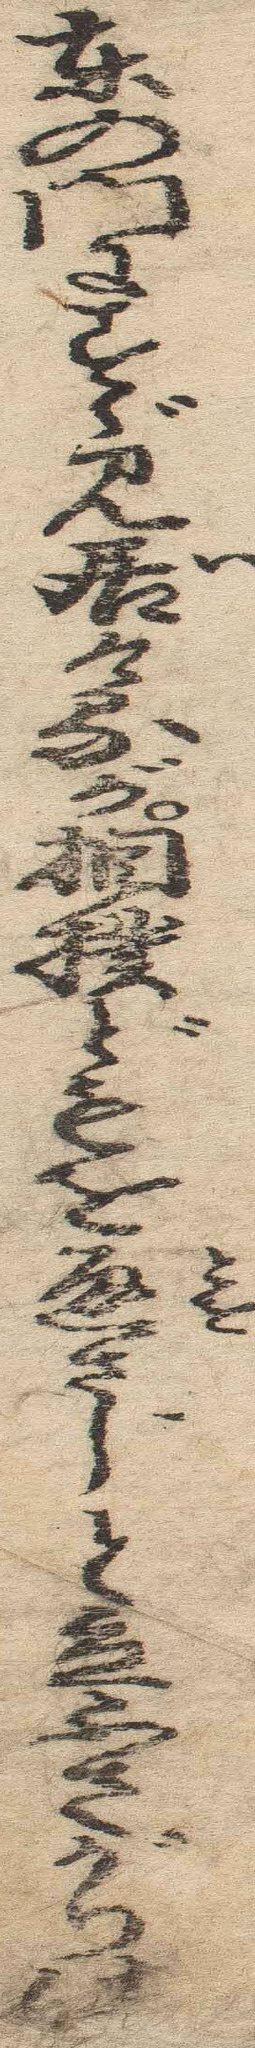東の門にすゞ見居けるが。相撲どもを通さじと立ふさがりけ
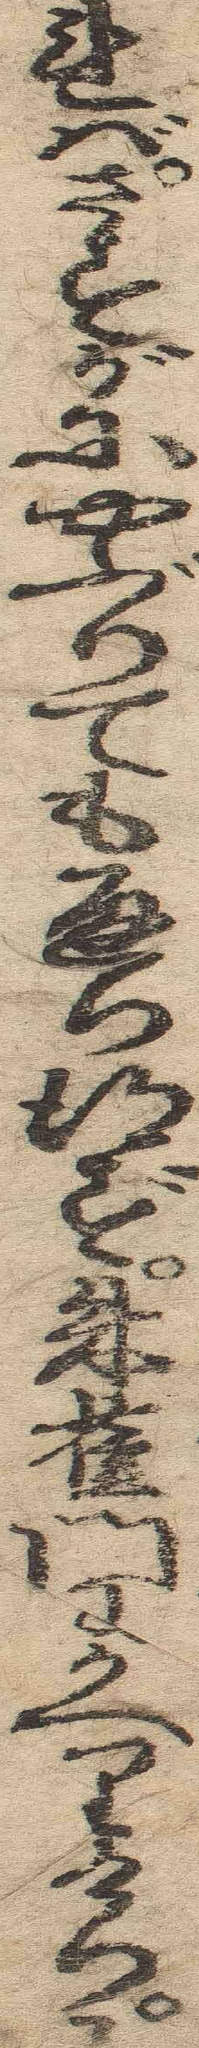れば。さすがにゆづりても通り得ず。朱雀門にかへりけり。そこに
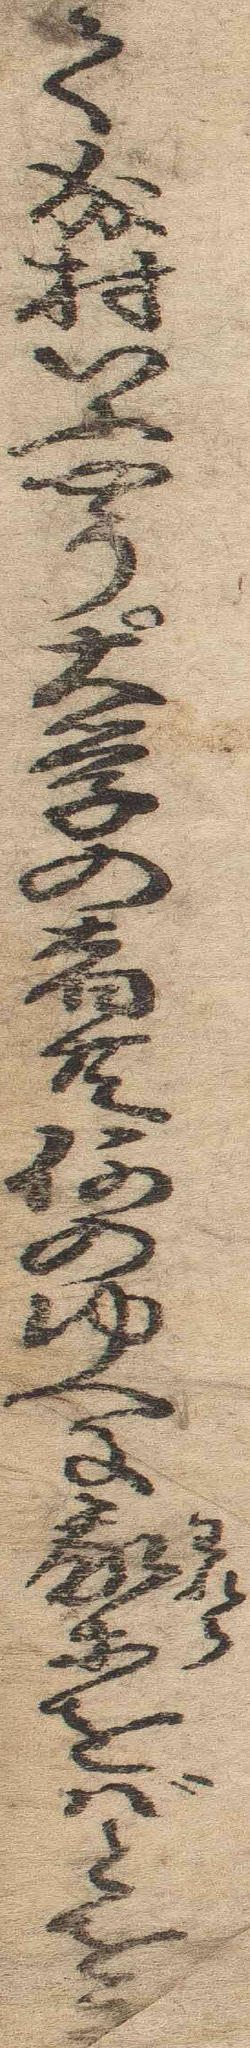て成村いふやう。大学の者共何のゆへに我等をばとをさぬや

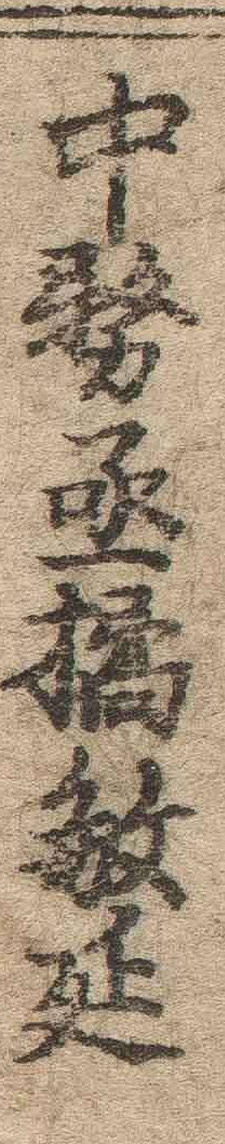中務丞橘敏延
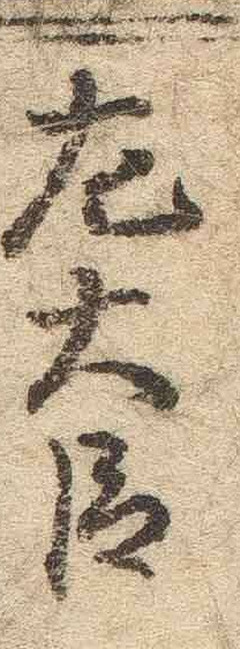左大臣
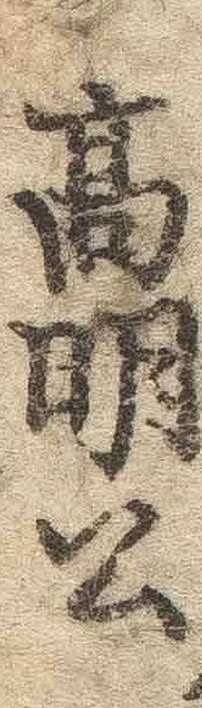高明公
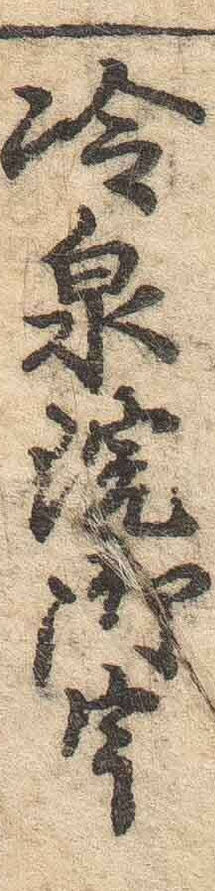冷泉院御宇
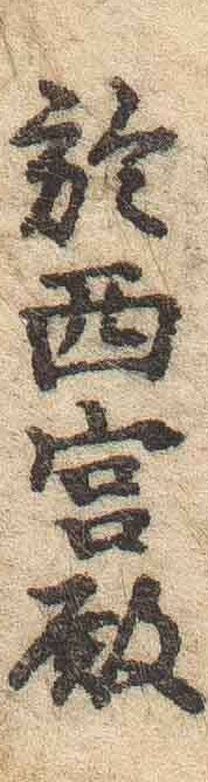於西宮殿
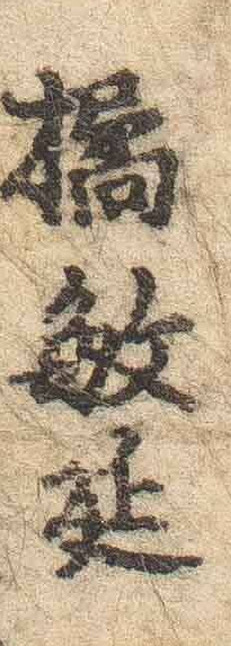橘敏延
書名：古今相撲大全
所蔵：東京学芸大学附属図書館 国文学研究資料館
